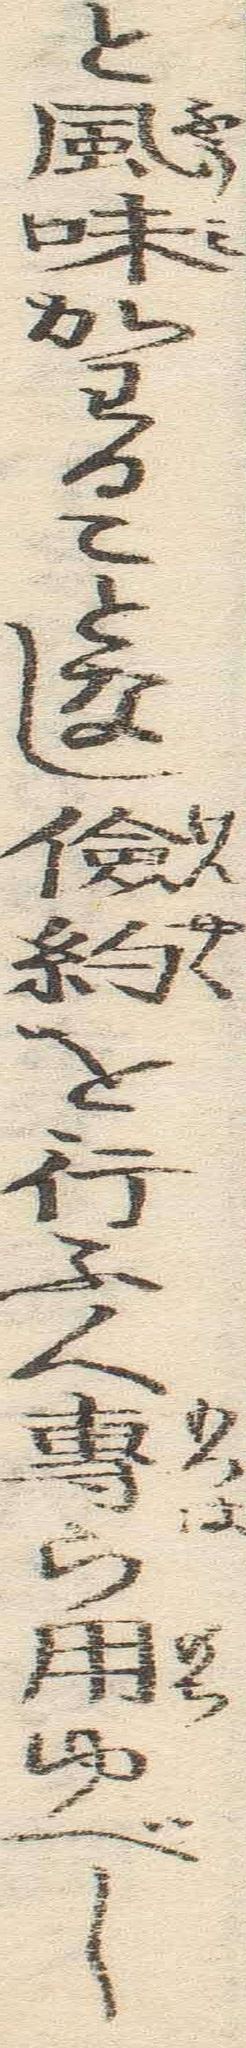と風味かわることなし倹約を行ふ人専ら用ゆべし
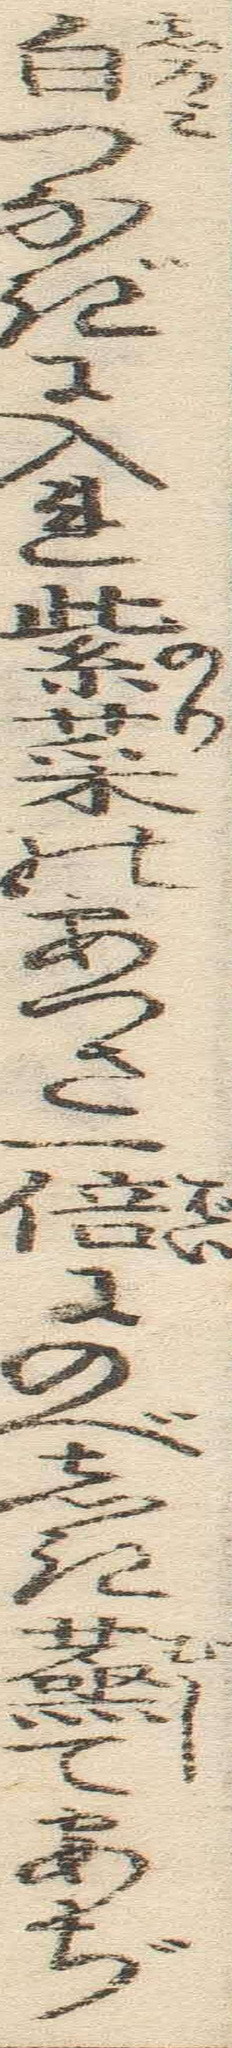白つなぎに入れ紫菜のあつさ一倍にのべしき蒸てあぢ

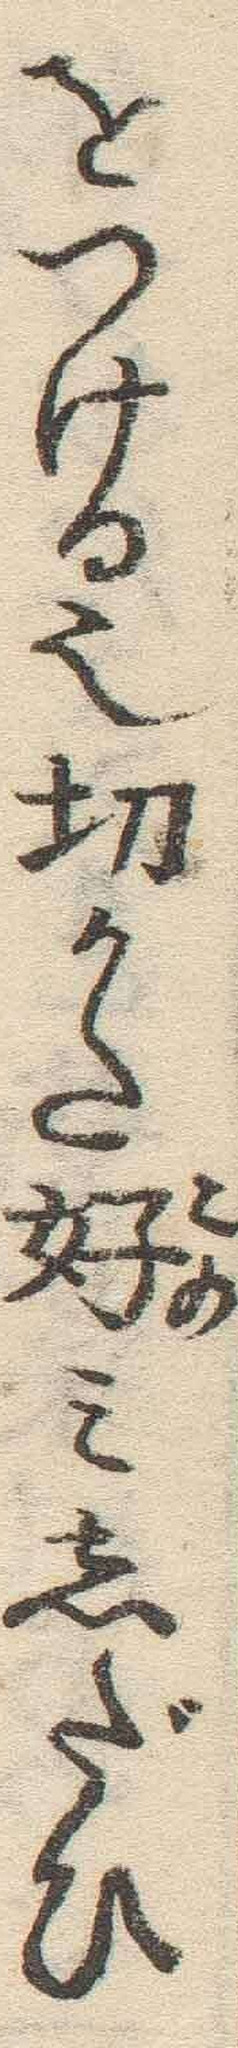をつける也切かた好みしだひ
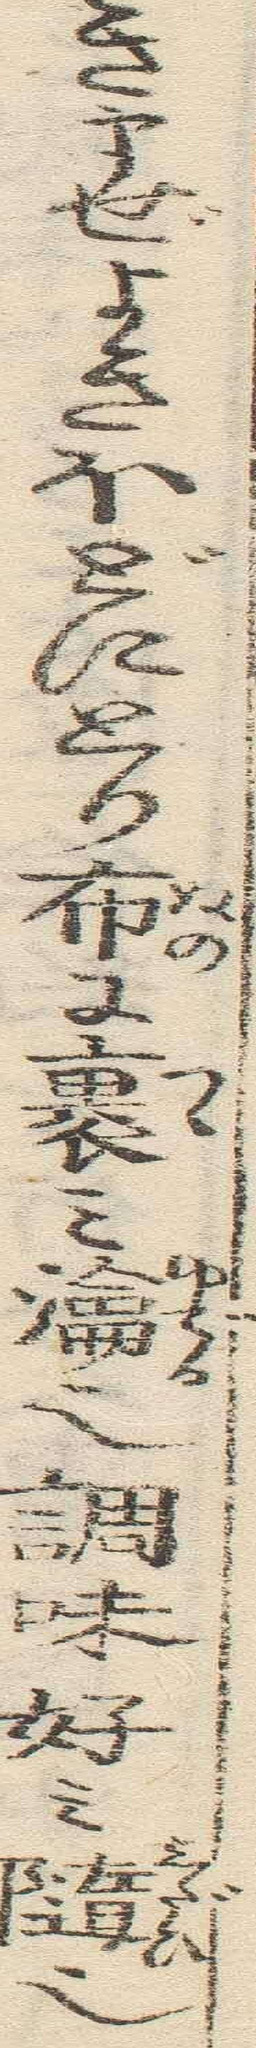きまぜよきほどにとり布に裹み瀹也調味好み随也
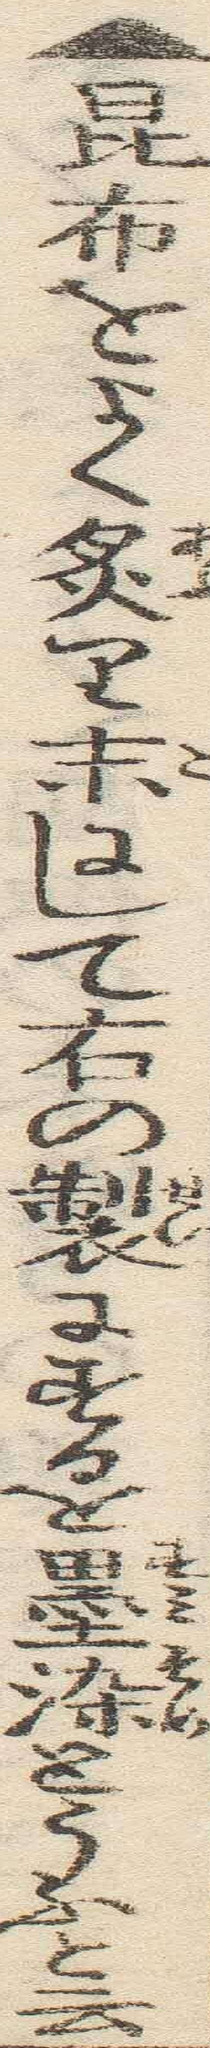▲昆布をよく炙り末にして右の製にするを墨染とうふと云
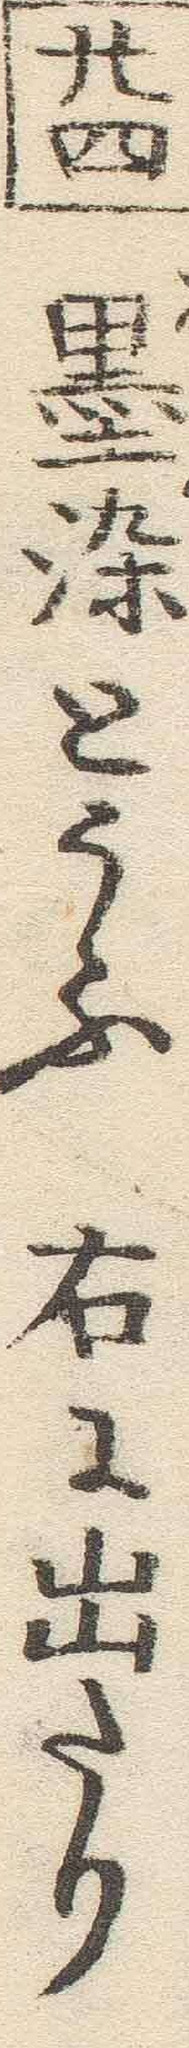[廿四]墨染とうふ右に出たり
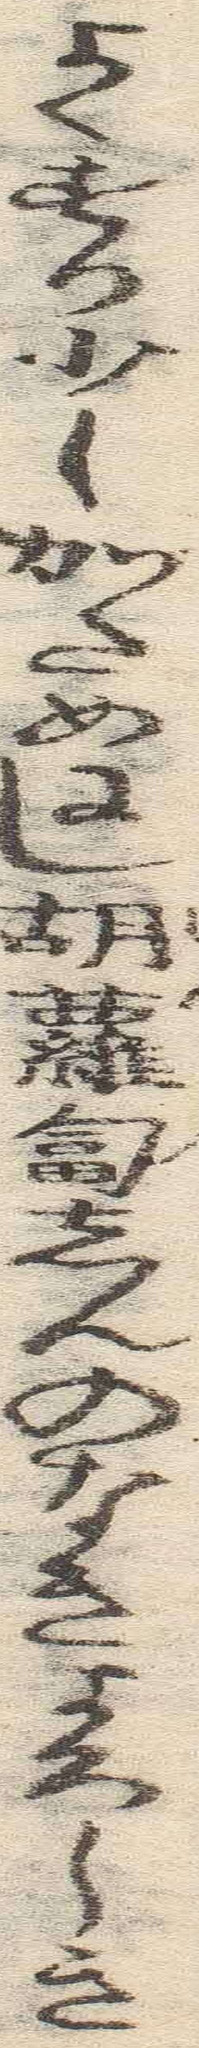よくすり少しかためにし胡蘿匐しんのなきよろしき
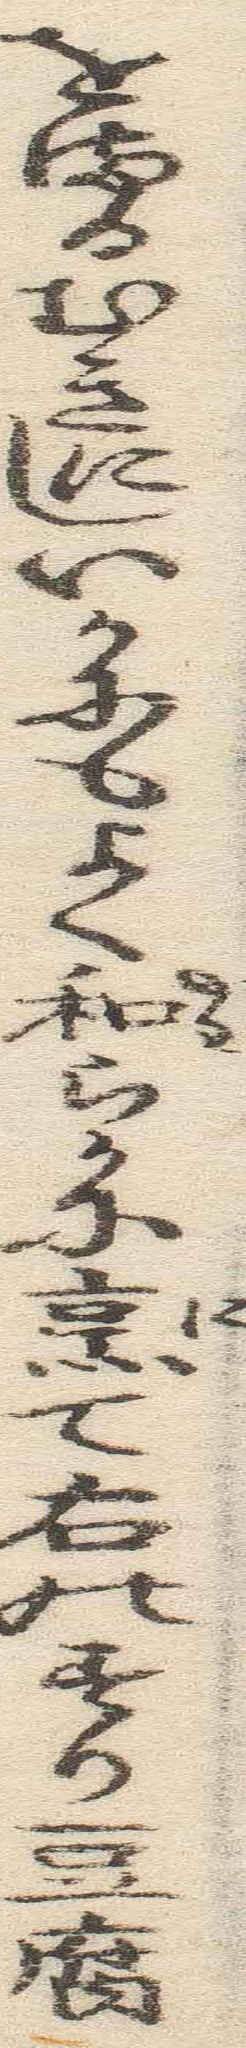をまるむきにしいかにもよく和らかに烹て右のすり豆腐
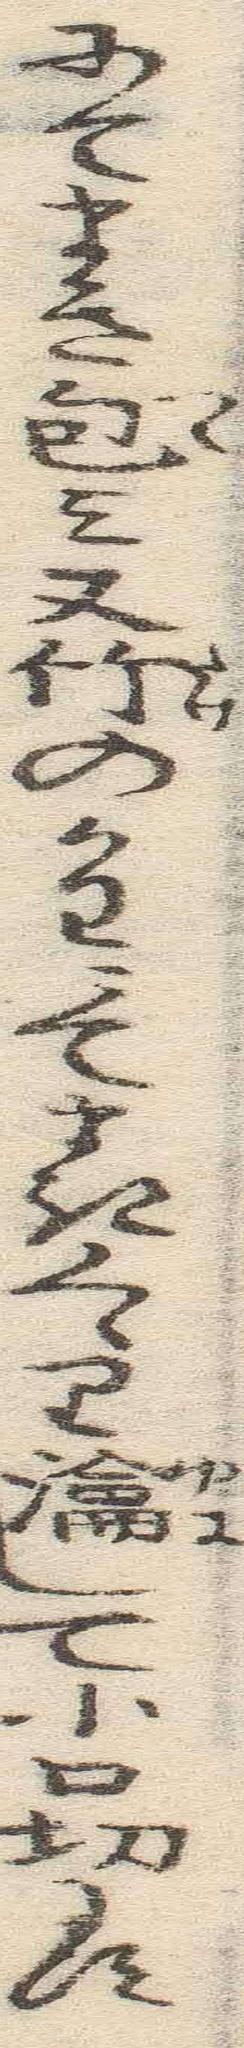にてまき包み又竹のかわにてまきくゝり瀹して小口切にす
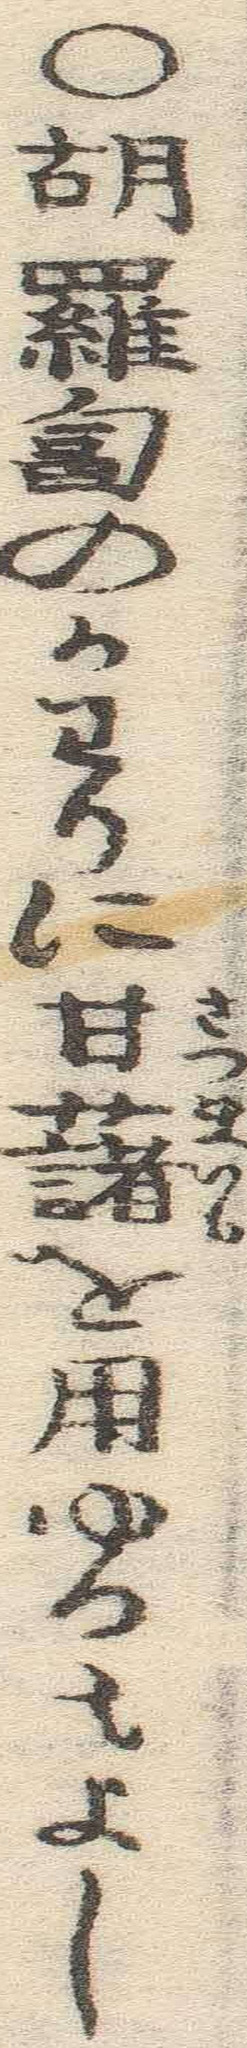○胡蘿匐のかわりに甘藷を用ゆるもよし

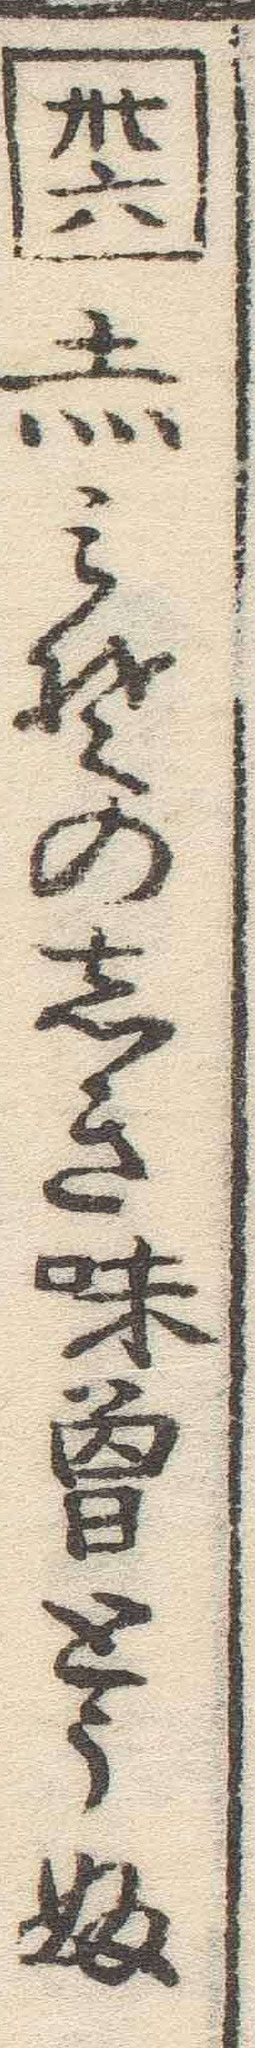[卅六]赤みそのしき味曽とうふ
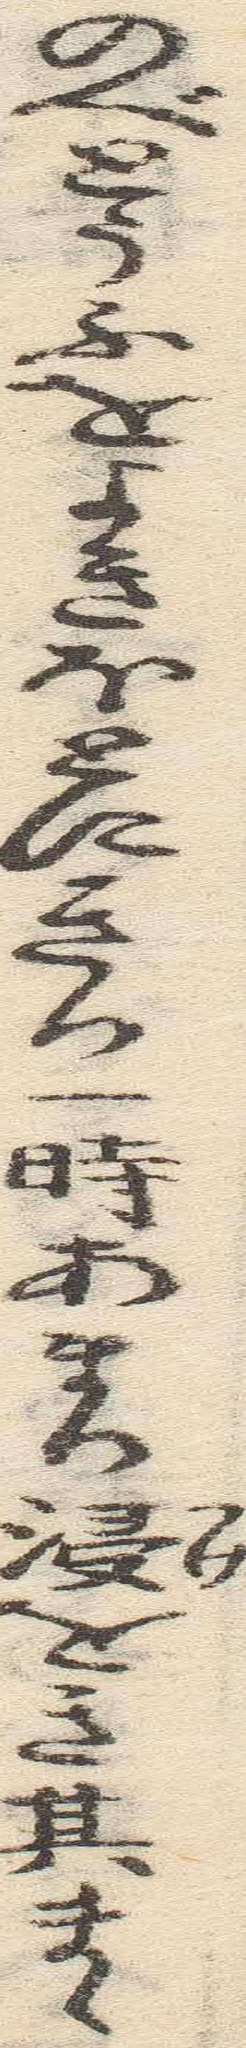のべとうふをよきほとにきり一時あまり浸をき其まゝ
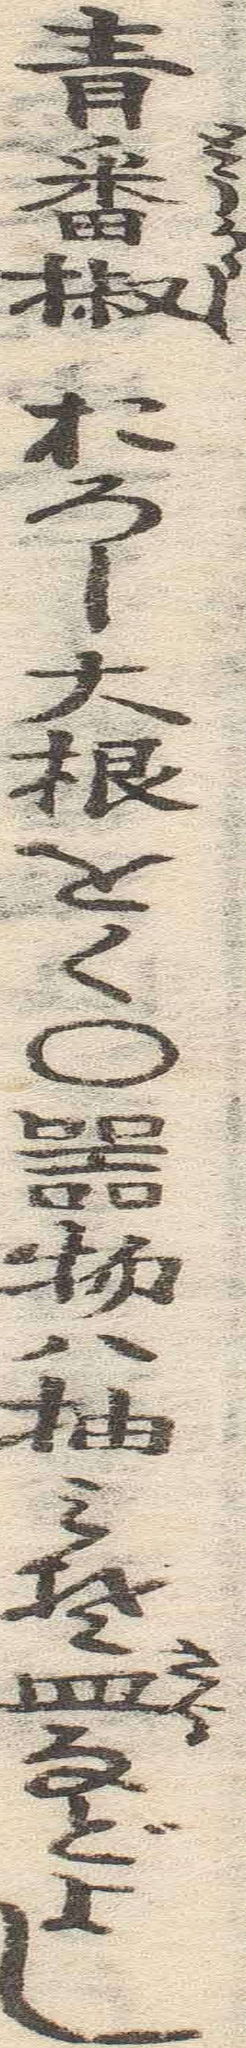青番椒おろし大根をく○器物は抽みそ皿などよし
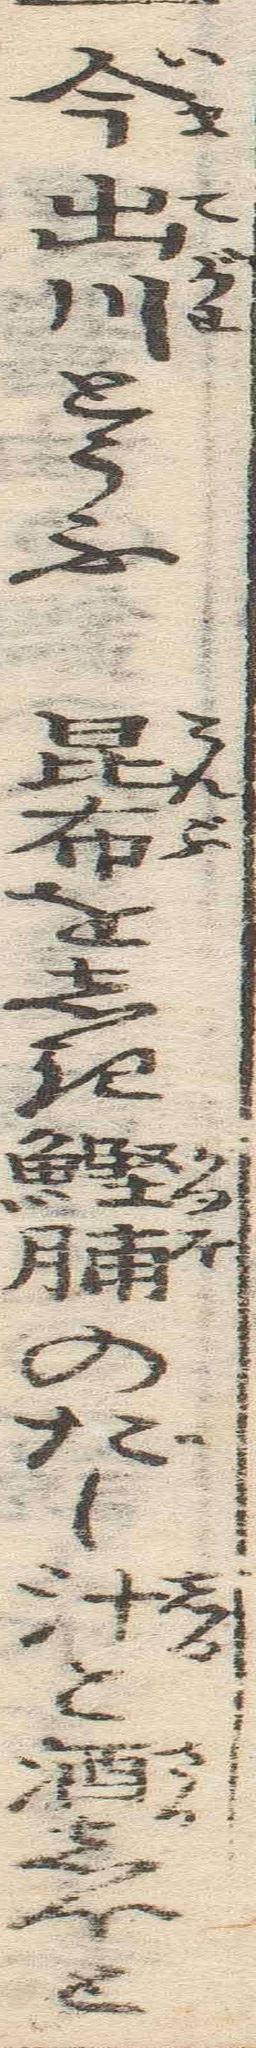[卅九]今出川とうふ昆布をしき鰹脯のだし汁と酒しほと
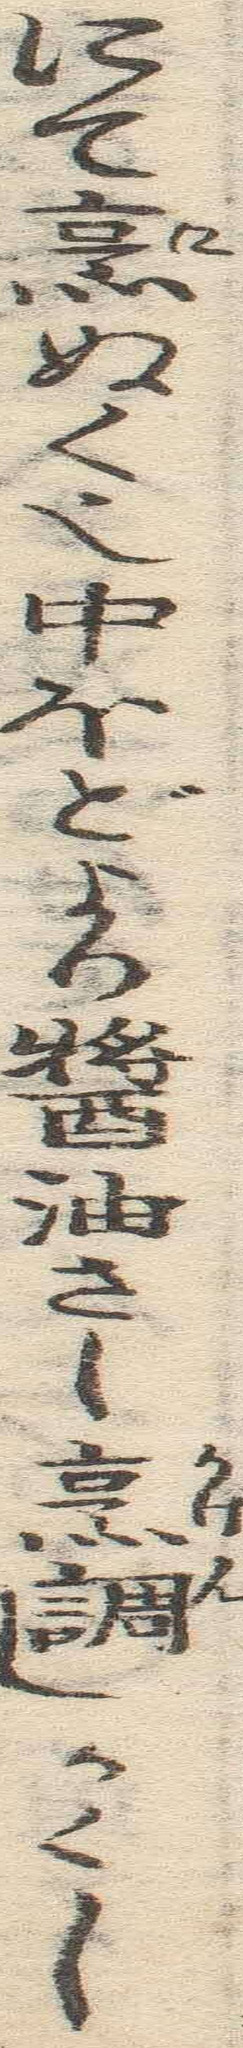にて烹ぬく也中ほどより醤油さし烹調しかくし
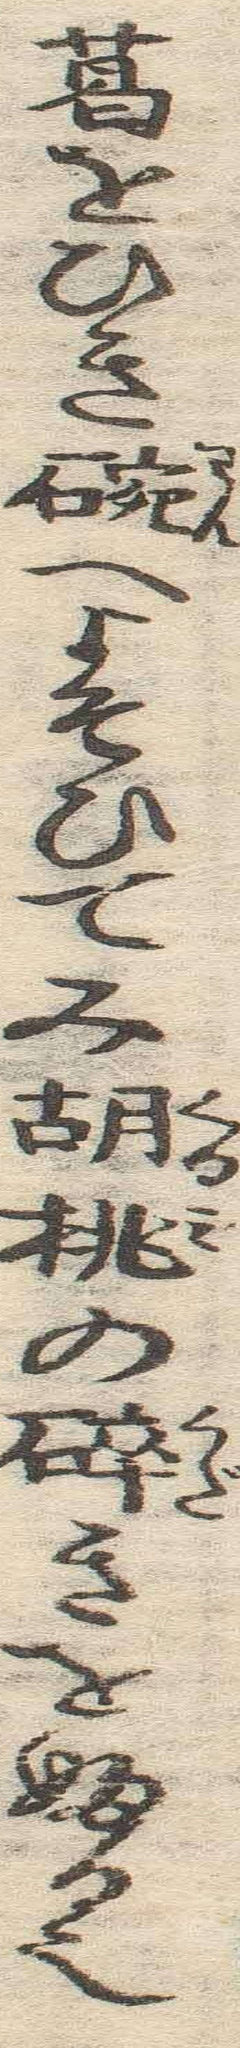葛をひき碗へよそひてみ胡桃の碎きをふる也
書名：豆腐百珍
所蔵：東京学芸大学附属図書館 国文学研究資料館
